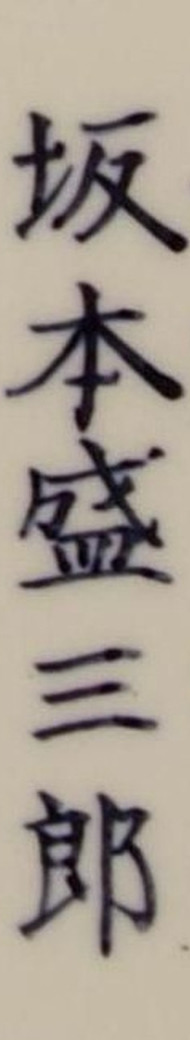坂本盛三郎
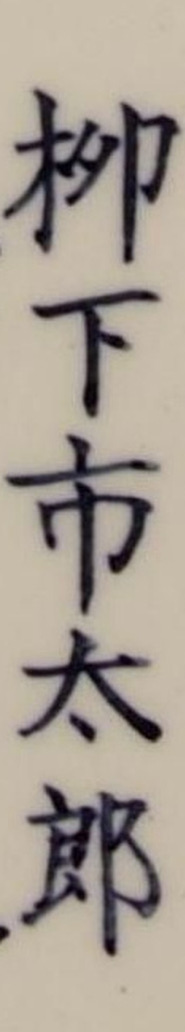柳下市太郎
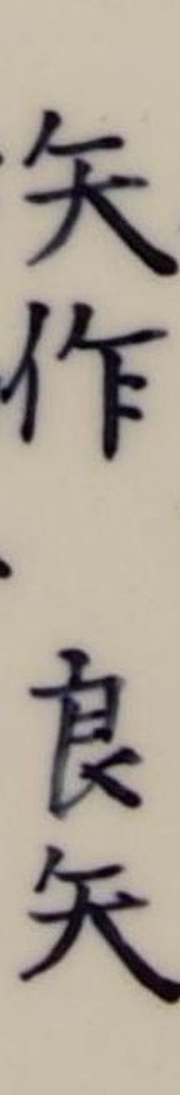矢作良矢
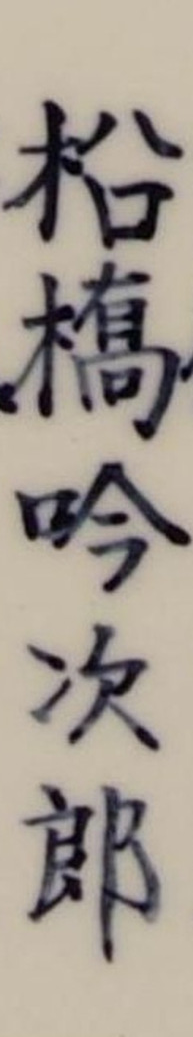松橋吟次郎
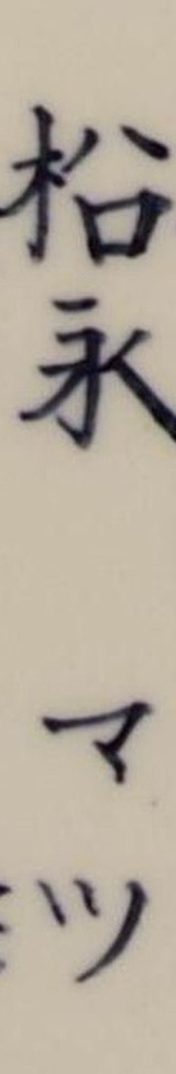松永マツ

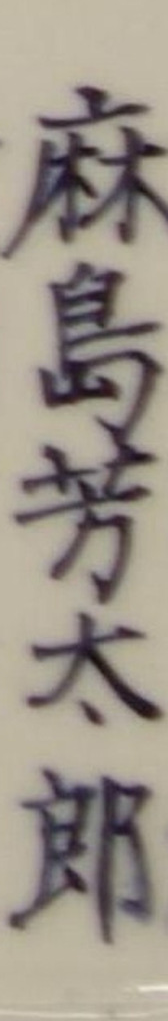麻島芳太郎
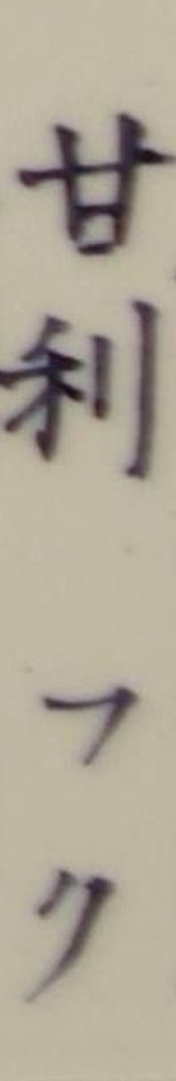甘利フク
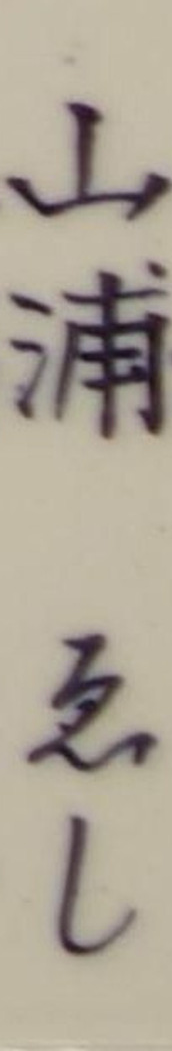山浦ゑし
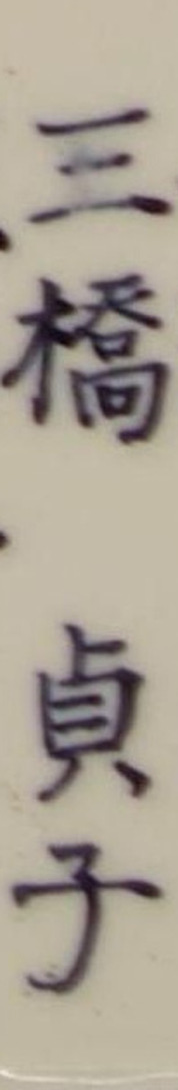三橋貞子
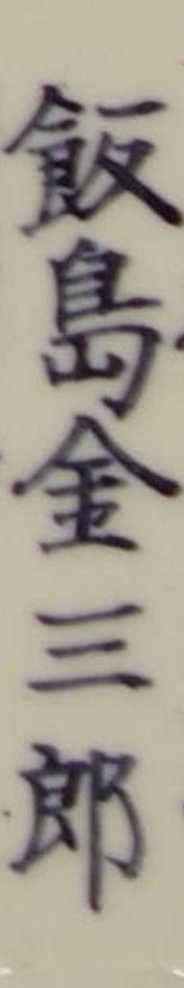飯島金三郎
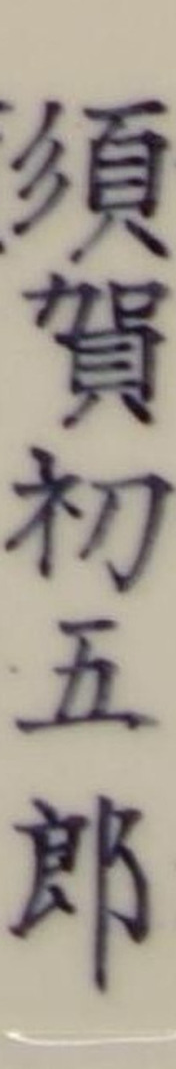須賀初五郎
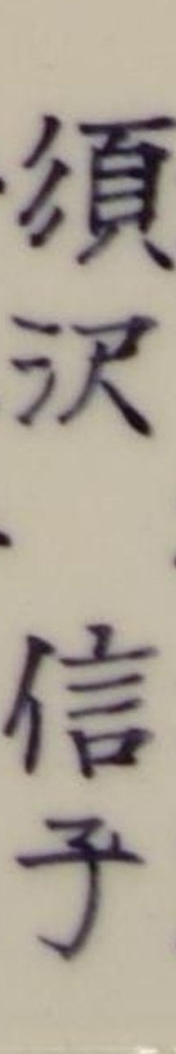須沢信子
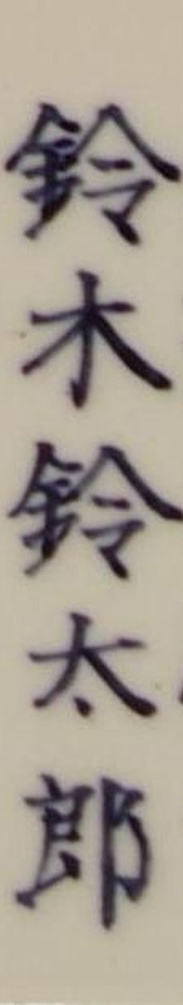鈴木鈴太郎
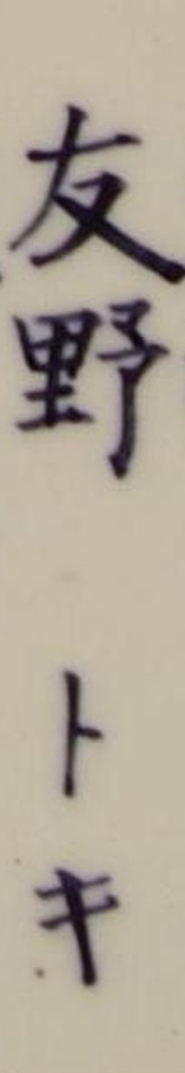友野トキ
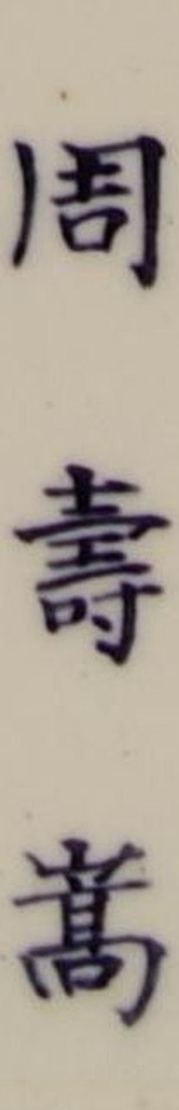周壽嵩
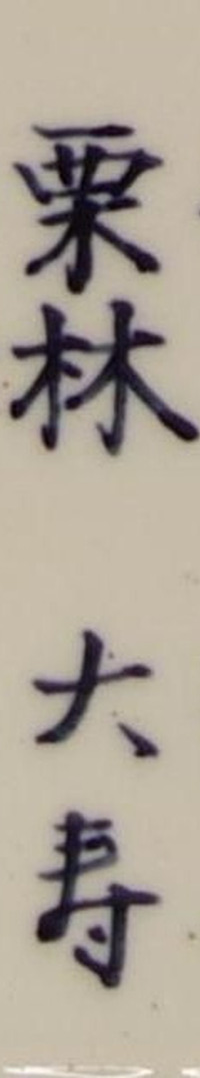栗林大寿
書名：M~S
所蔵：高野山金剛峯寺
